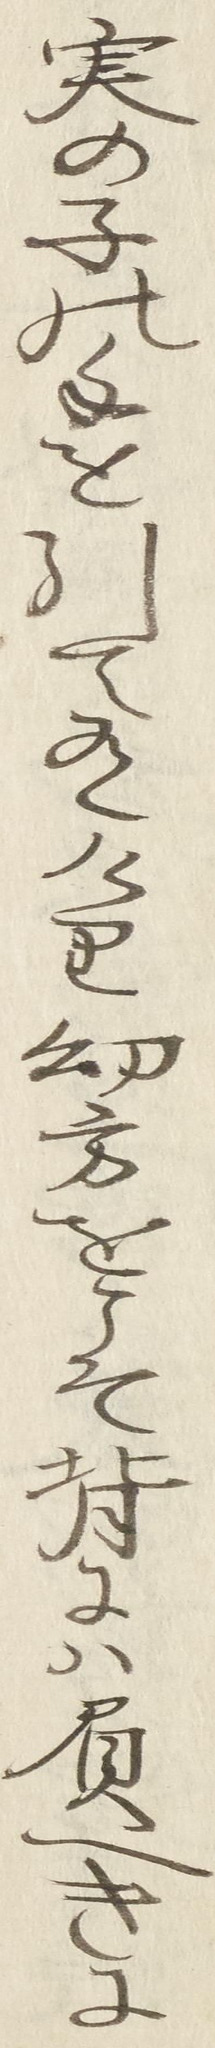実の子の手を引て有けり幼方をこそ背には負へきに
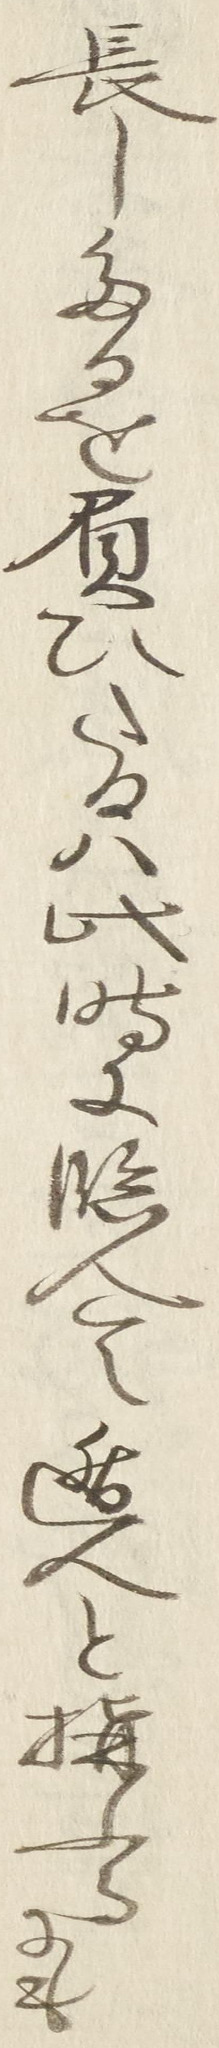長したるを負ひたるは此時に臨人て遁人と構ふるにも
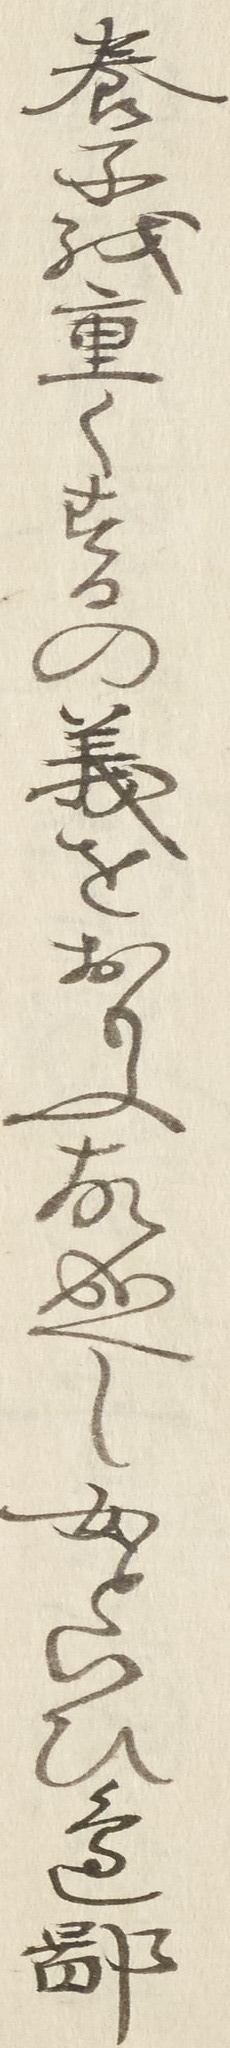養子を重くするの義をおもふ故成へし女といひ辺鄙
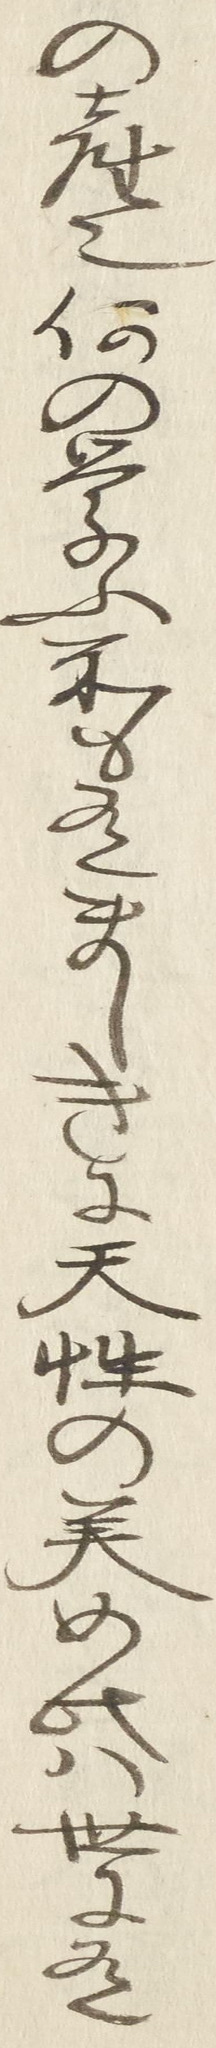の産也何の学ふ前も有ましきに天性の美め此は世に有
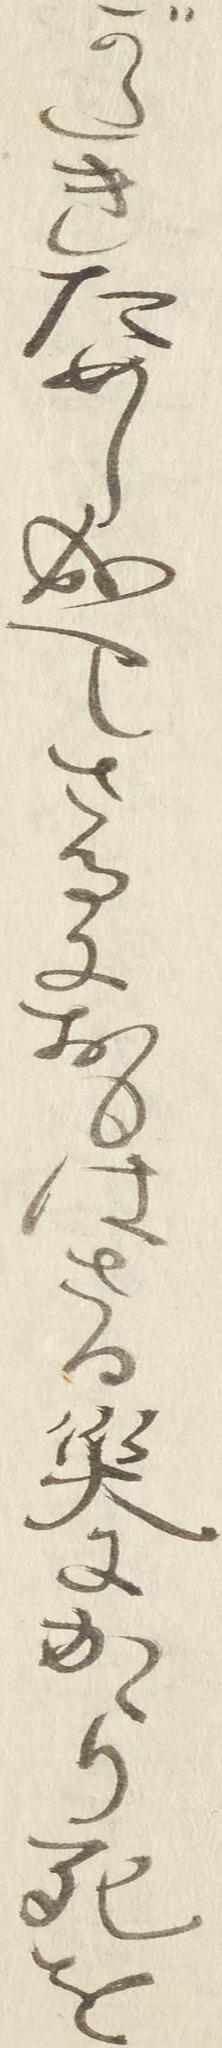がたきためし成へしさるにおもはさる災にかゝり死を
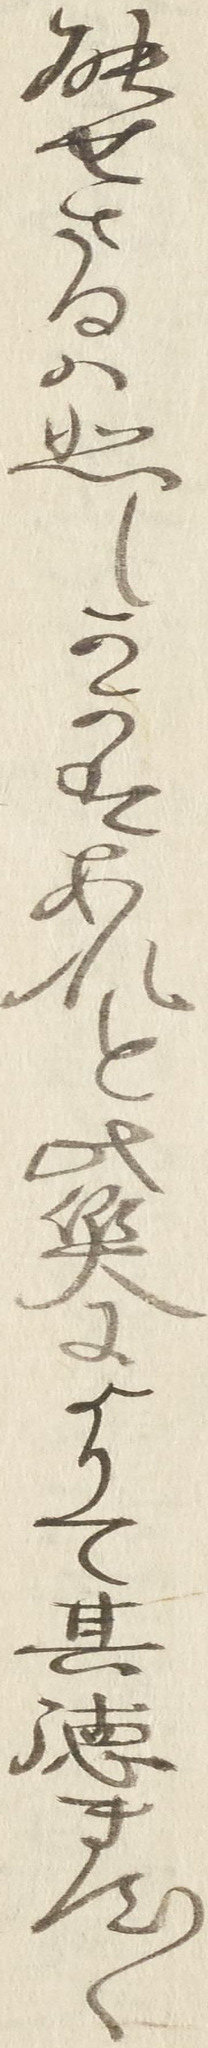能せさるは悲しからすあれと此災によりて其徳ます〳〵
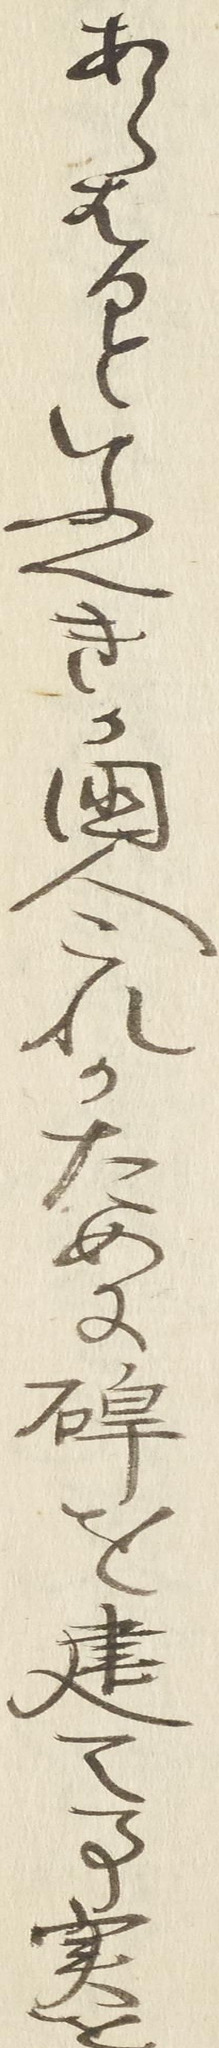あらはるといふへきか国人これかために碑を建て事実を
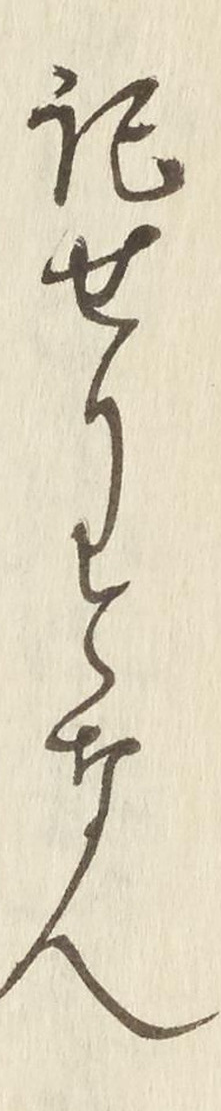記せりとなん
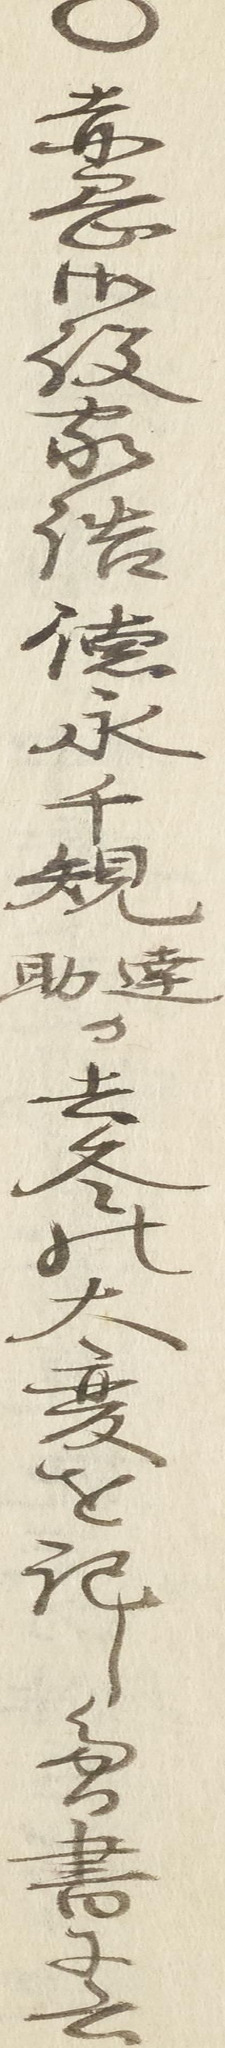〇赤岡御役家詰徳永千規達助か去冬の大変を記したる書に云
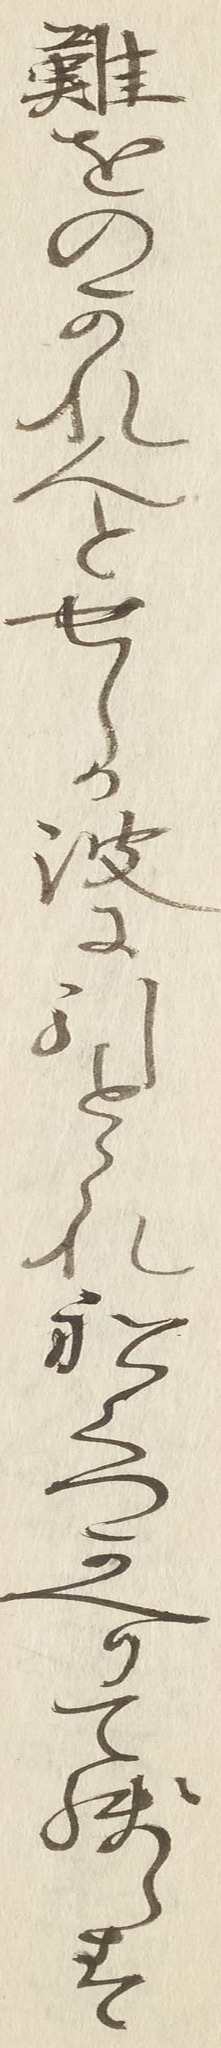難をのかれんとせしか波に引とられ船くつかへりて残らす
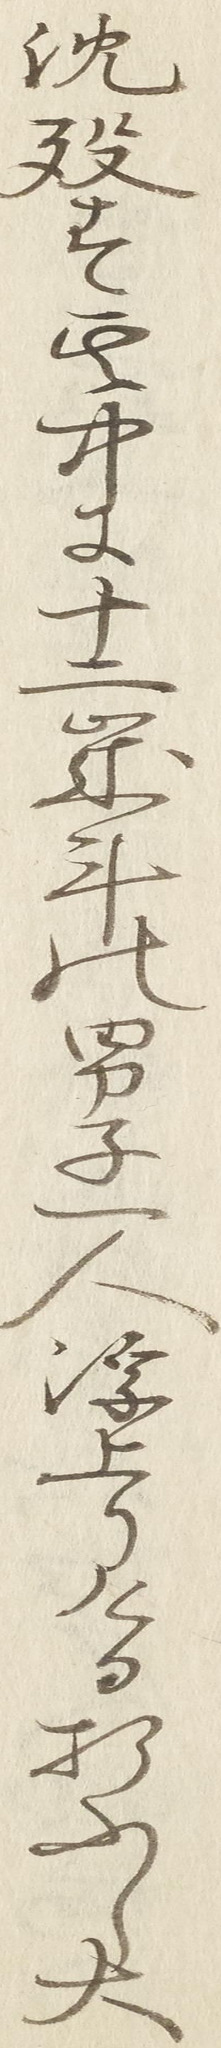沈没す其中に十二歳斗の男子一人浮上りける折ふし大
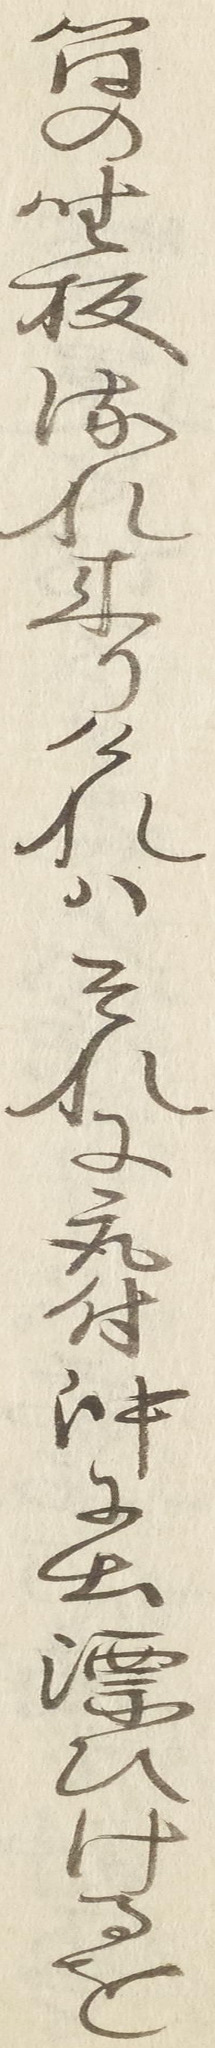筒の座板流れ来りけれはそれに取付け沖に出漂ひけるを
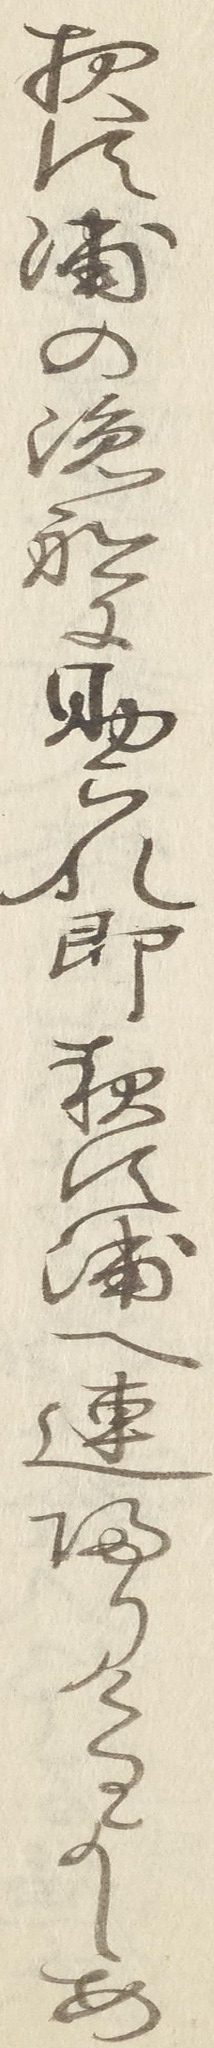夜須浦の漁船に助けられ則夜須浦へ連帰りけるよしあ
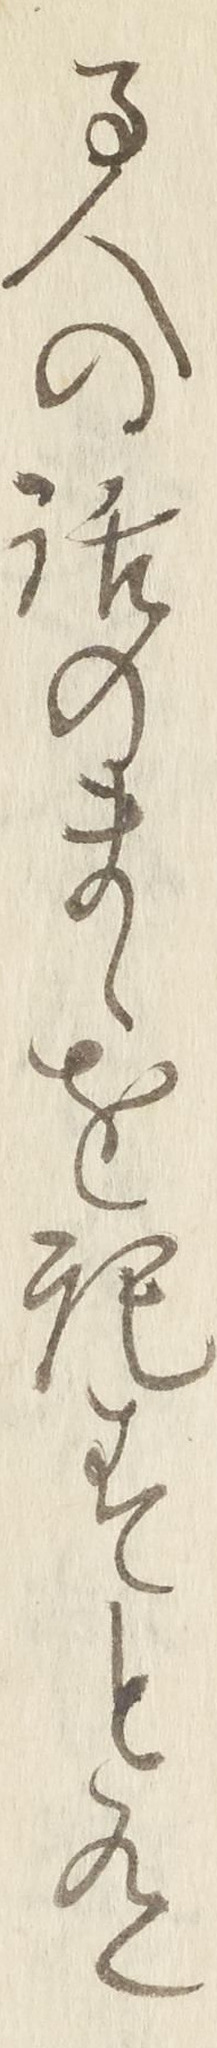人の話のまゝを記すと有
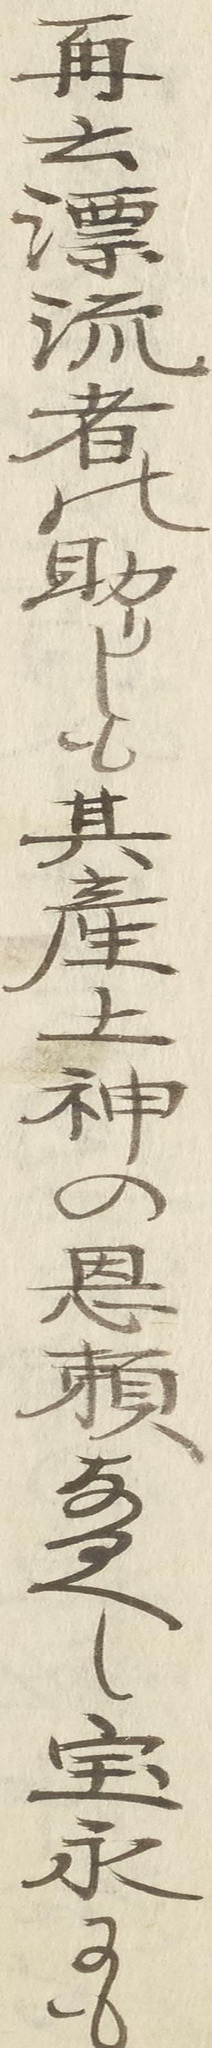再云漂流者の助りしも其産土神の恩頼あるへし宝永にも
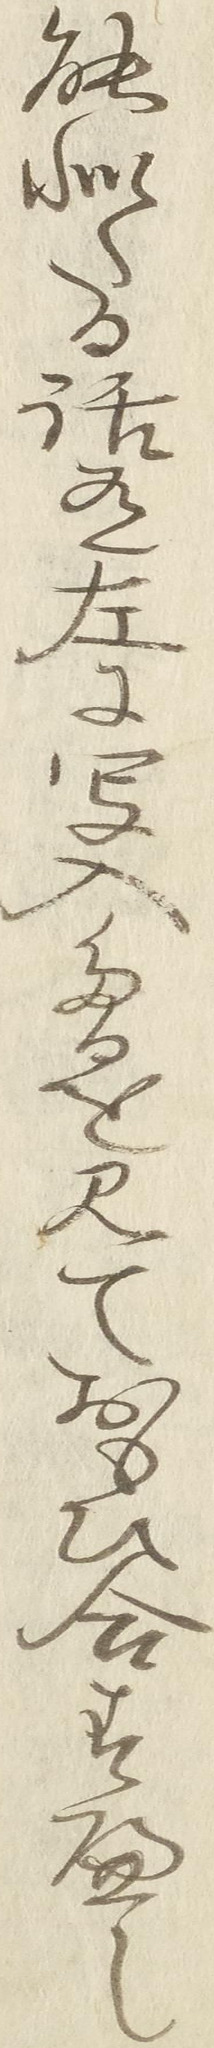似たる話有左に写入たるを見ておもひ合すへし
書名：地震記　上
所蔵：東京大学地震研究所図書室 Earthquake Research Institute Library, The University of Tokyo, JAPAN
